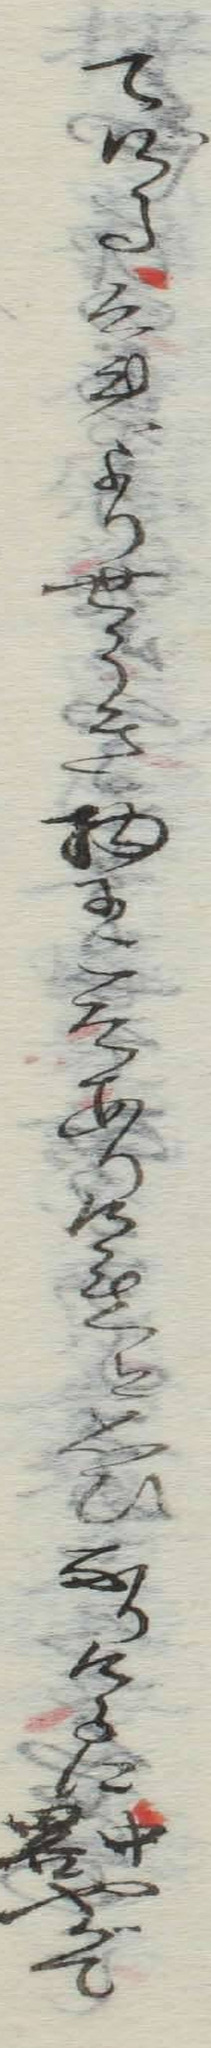てける、それより世うき物にこそありけれと思ひなりけるに中略やがて
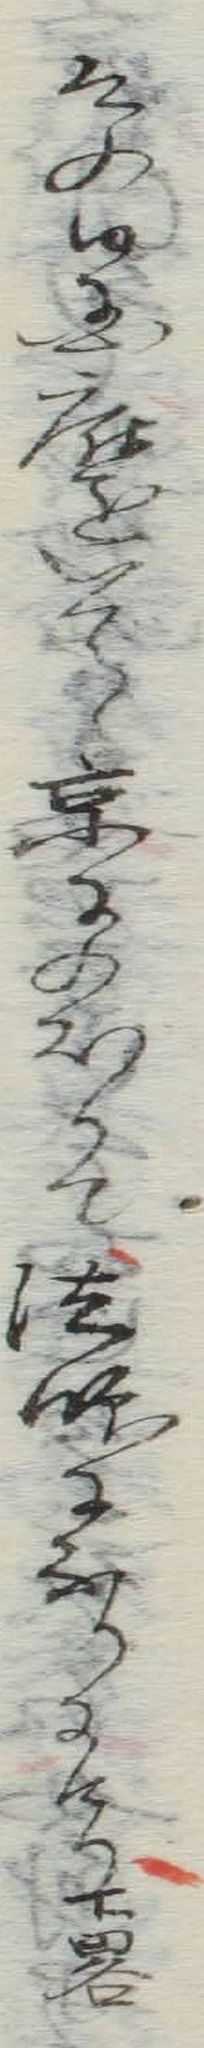その日国府をいでゝ京にのほりて、法師になりにけり、下略
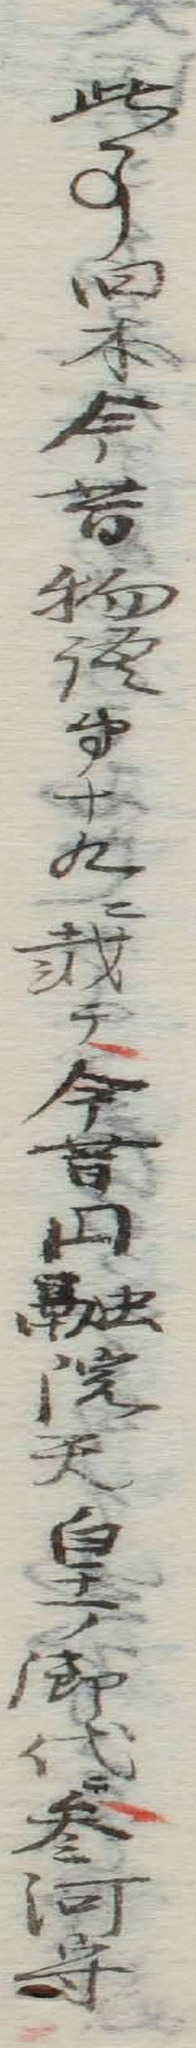此事旧本今昔物語第十九ニ載テ、今昔円融院天皇御代ニ、参河守
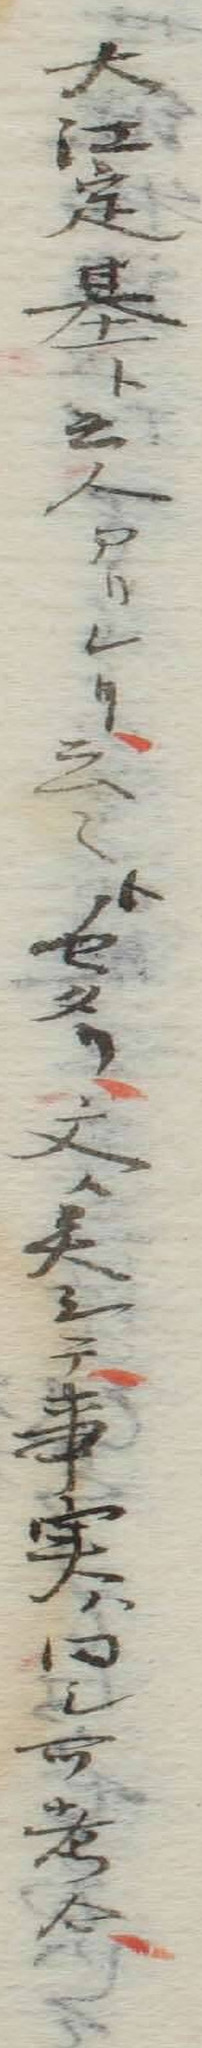大江定基ト云人アリレリ、云々トノセタリ、文ハ異シテ、事実ハ同シ可考合、

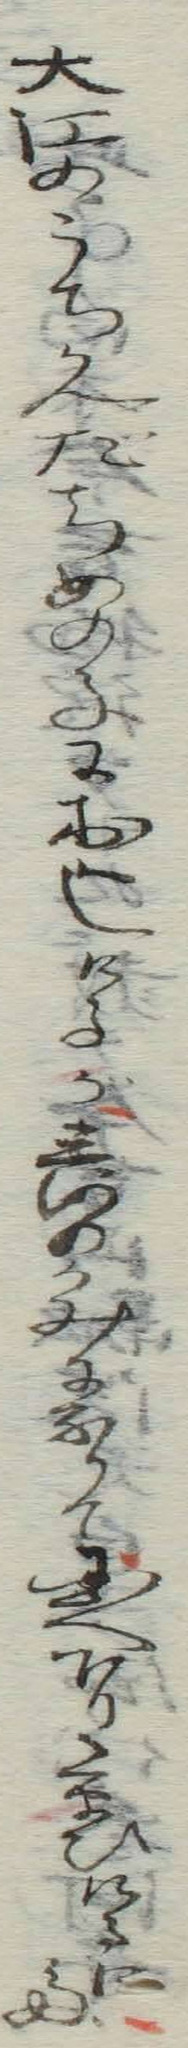大江のうちかんだちめの子におはしけるが、三河のかみになりて、国へ下りたまひけるに、た
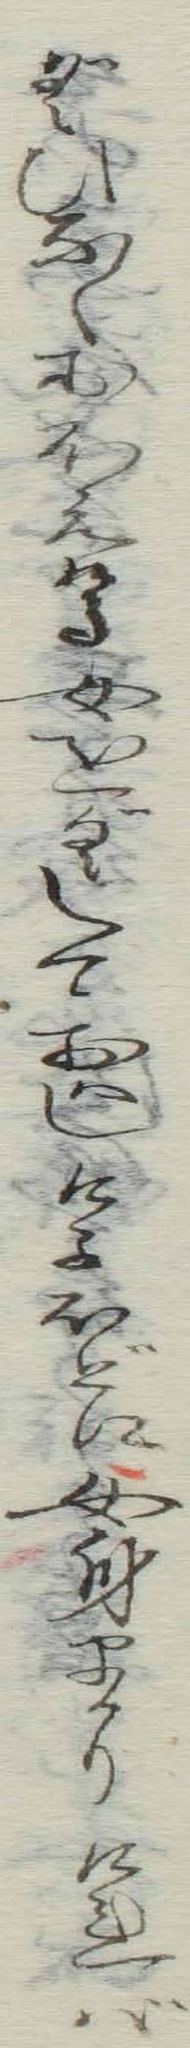ぐひなくおほえける女をぐしておはしけるほどに、女身まかりければ
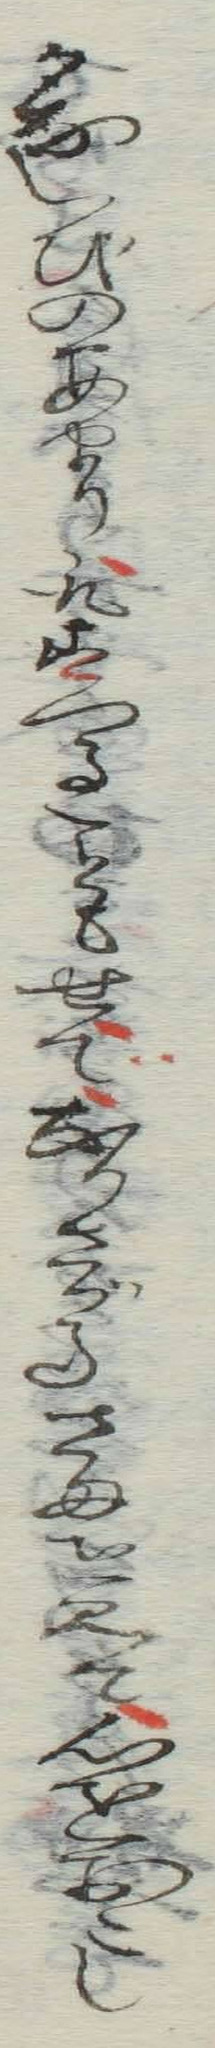かなしびのあまり、取すつることもせ、で、なりさがるさまを見て、心をおこし
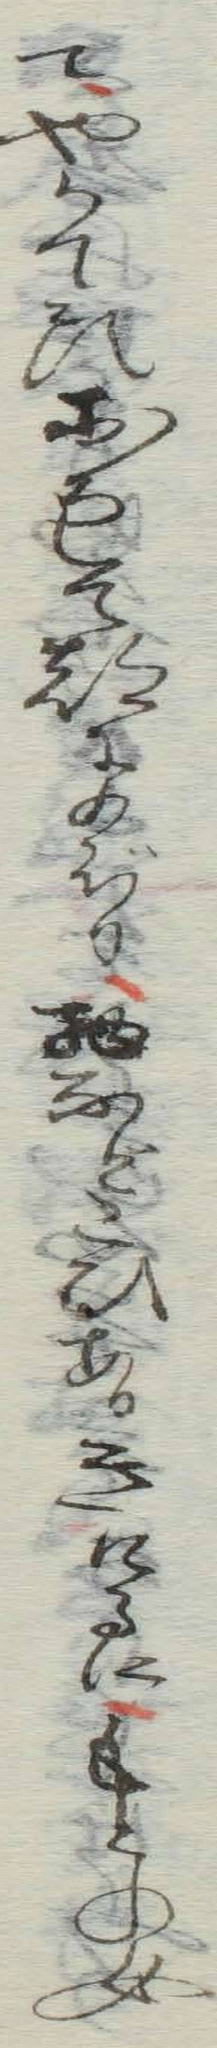て、やかて頭おろして都にのぼり、物などこひあるきけるに、もとの女
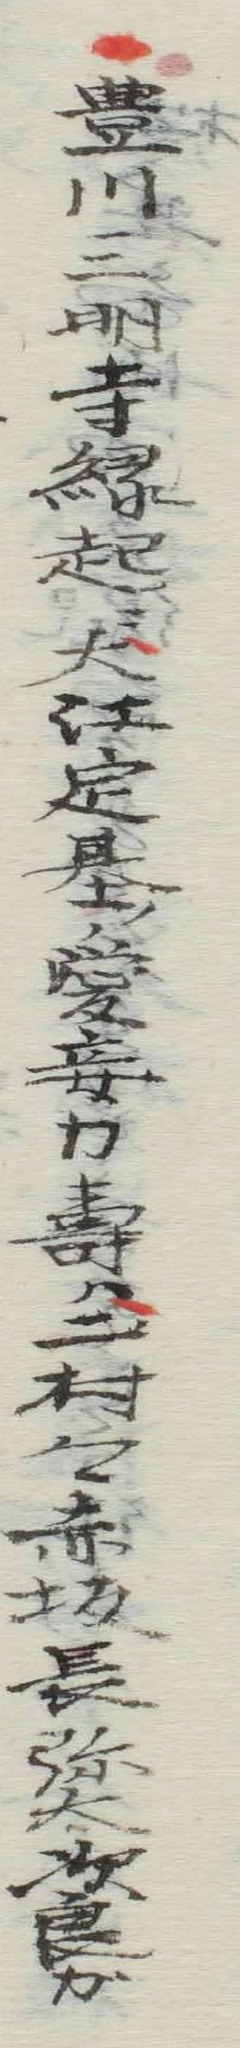●豊川三明寺縁起ニ大江定基愛妾力壽ハ二村郷赤坂長弥太次良ガ
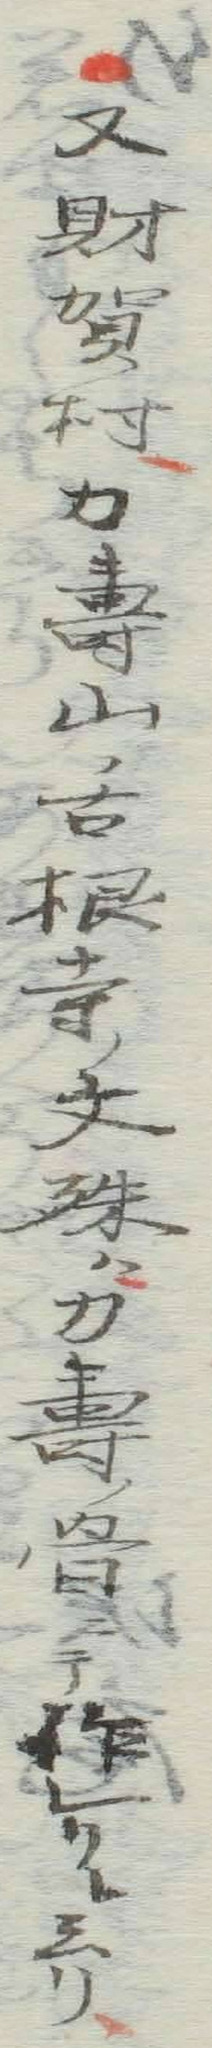●又財賀村、力壽山舌根寺文殊ハ力壽骨ニテ作レリト云リ
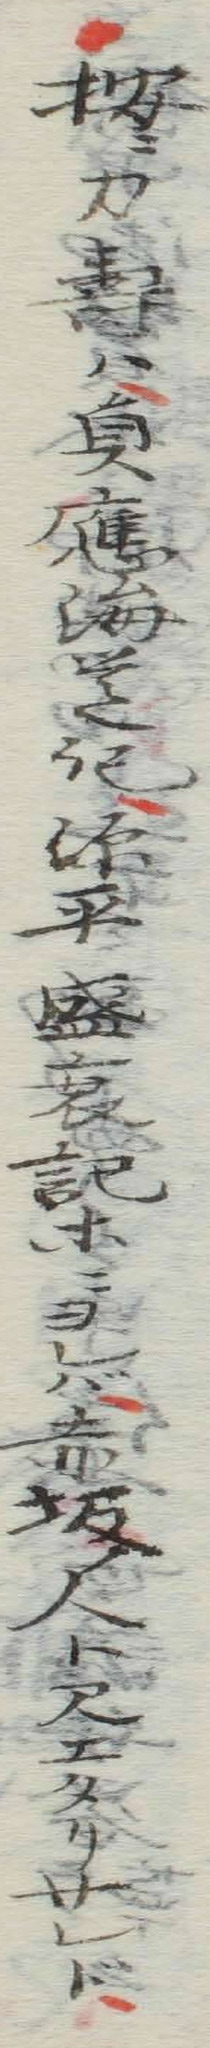●按ニ力壽ハ、貞應海道記、源平盛衰記等ニヨレバ、赤坂ノ人ト見エタリサレド、
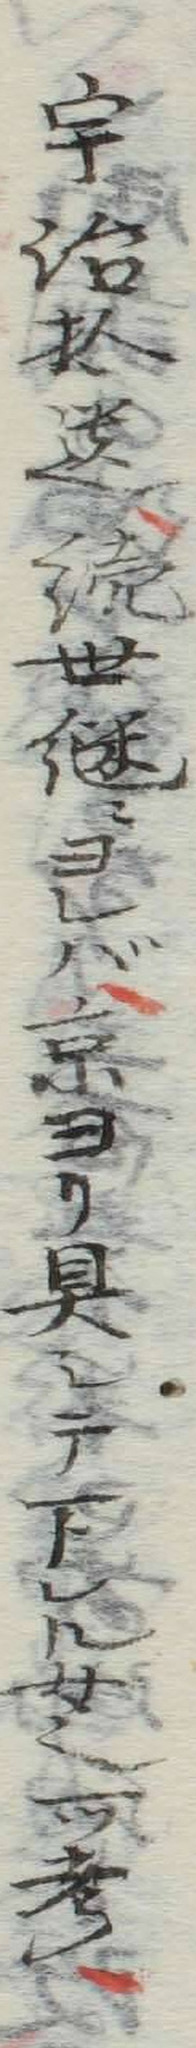宇治拾遺、続世継ニヨレバ、京ヨリ具シテ下レル女也可考、

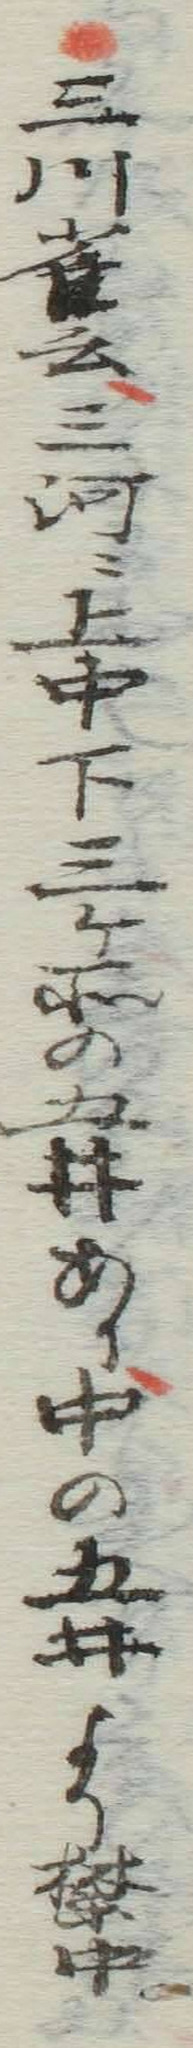●三川雀云、三河ニ上中下三ケ所の五井あり、中の五井より禁中
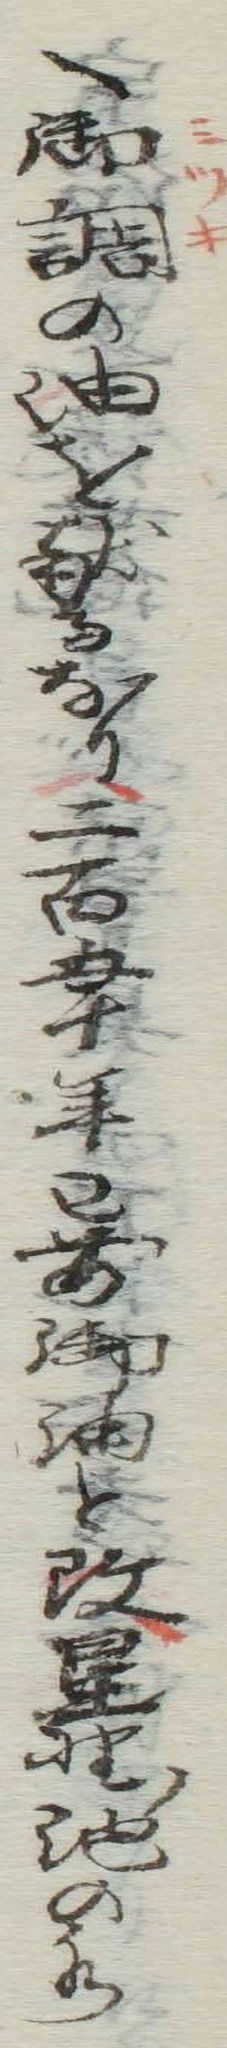へ御調の油を献るなり、二百五十年已前御油と改め星野池の水
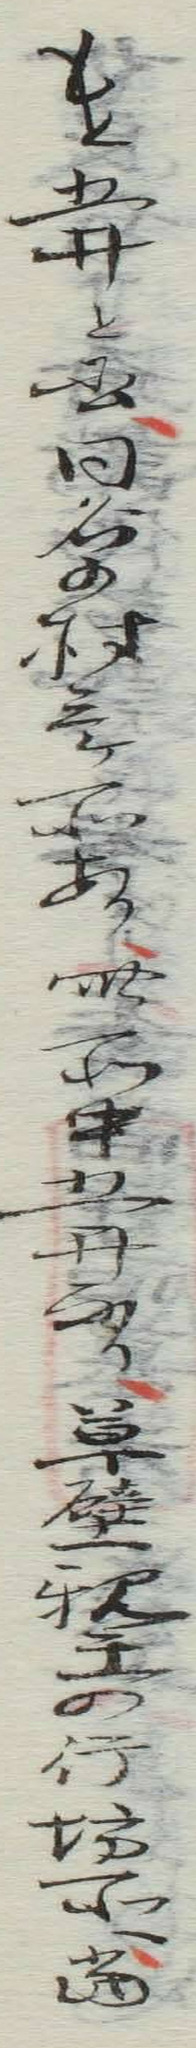もと五井と書、同名の村三ケ所あり、此所中五井なり、草壁親王の行坊所へ、当
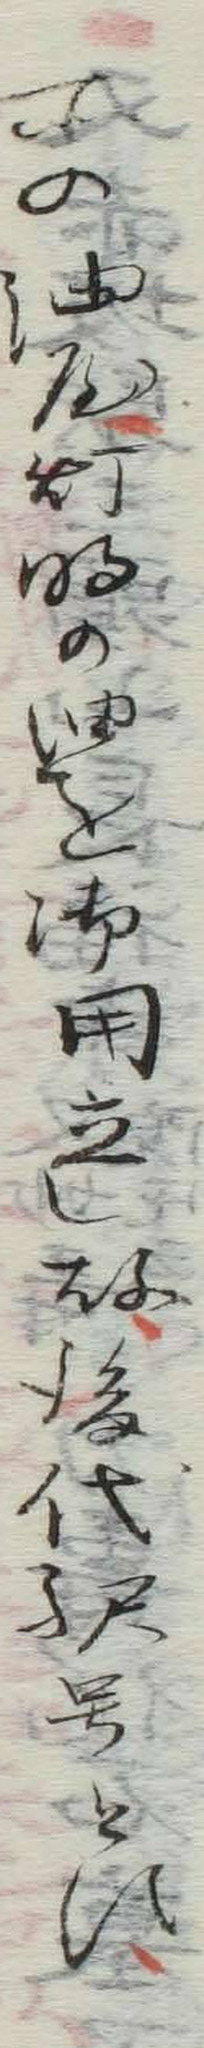所の油屋、灯明の油を御用立し故、後代駅号とす、
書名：三河国古跡考
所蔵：国文学研究資料館
